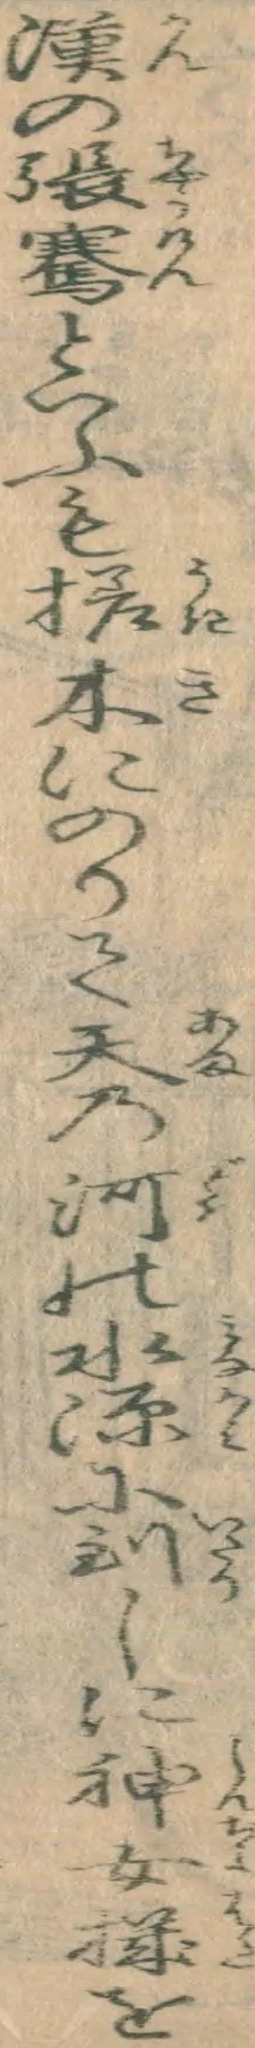漢の張騫といふも槎木にのりて天の河の水源に到しに神女機を
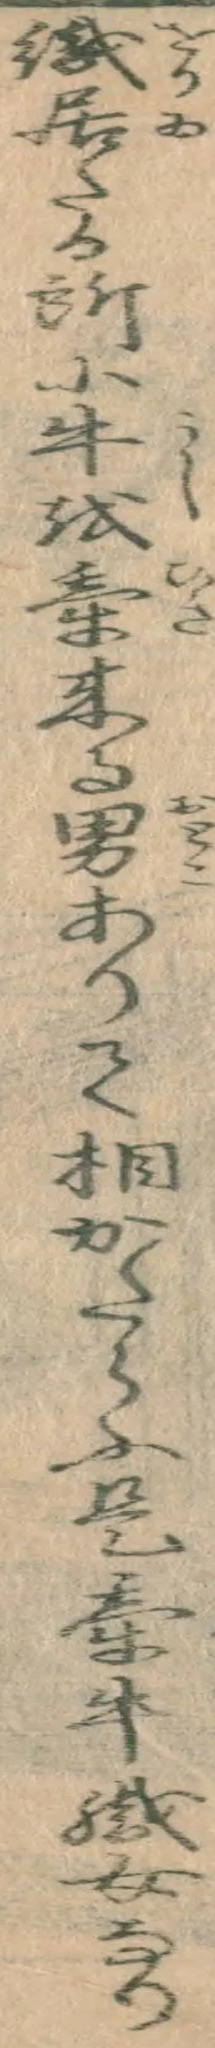織居たる所に牛を牽来る男ありて相かたらふ是牽牛織女なり
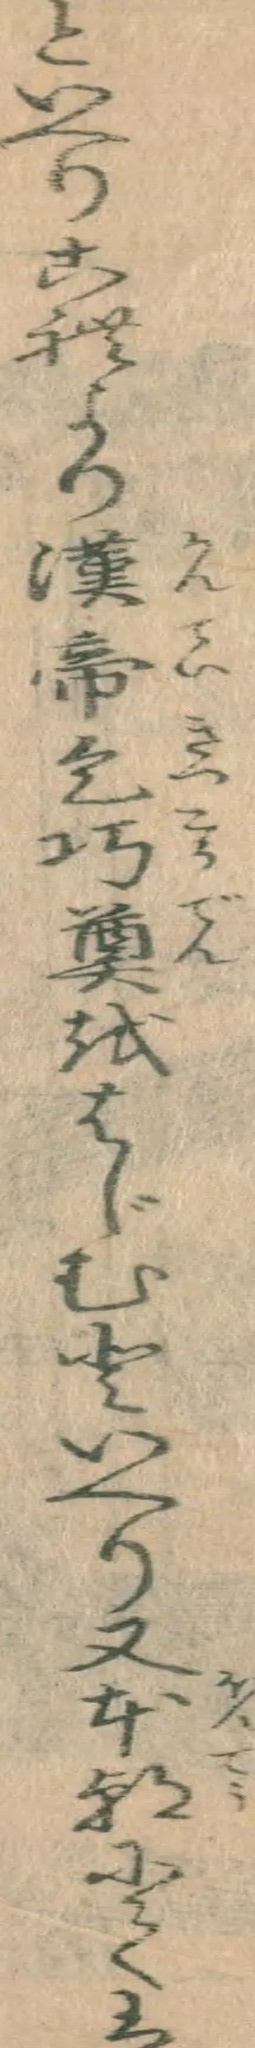といへりこれより漢帝乞巧奠をはじむといへり又本朝にては
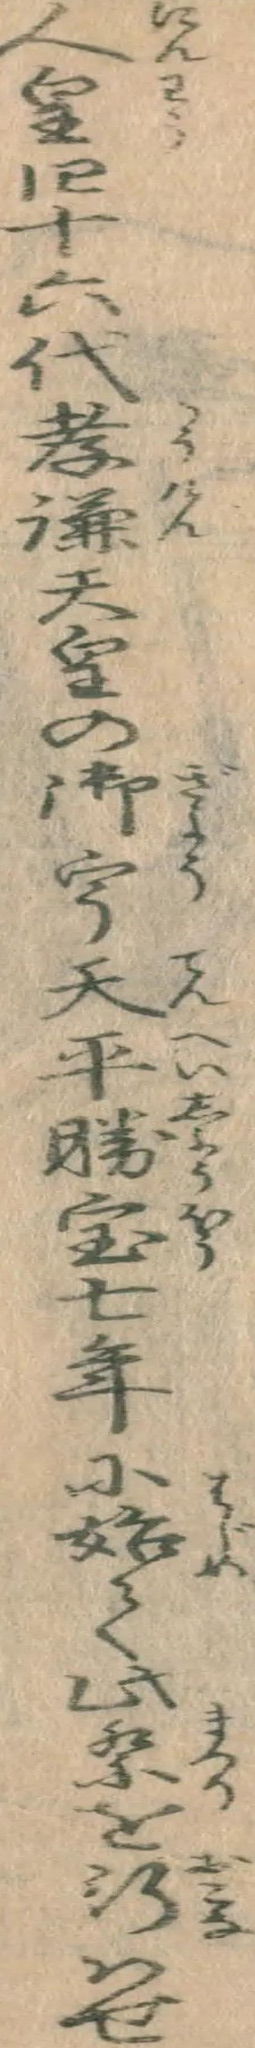人皇四十六代孝謙天皇の御宇天平勝宝七年に始て此祭を行はせ
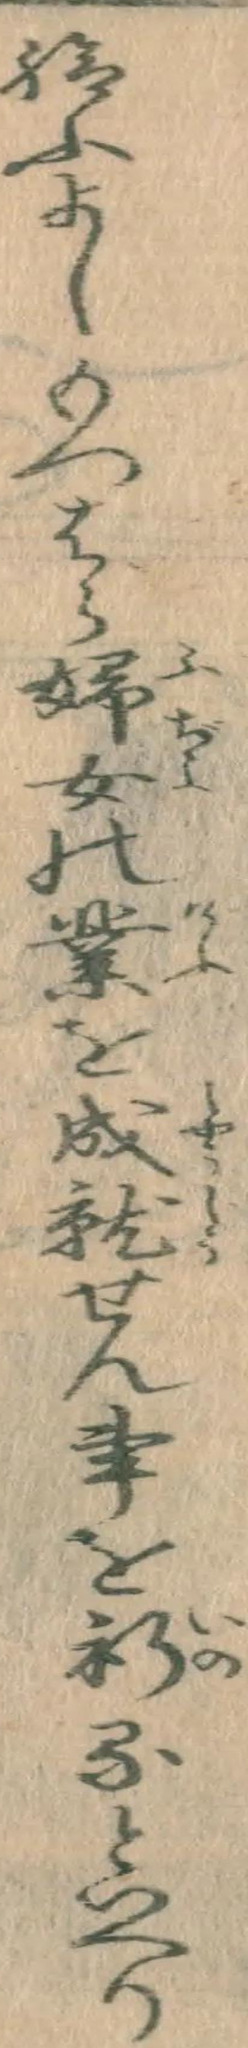給ふよしもつはら婦女の業を成就せん事を祈るといへり
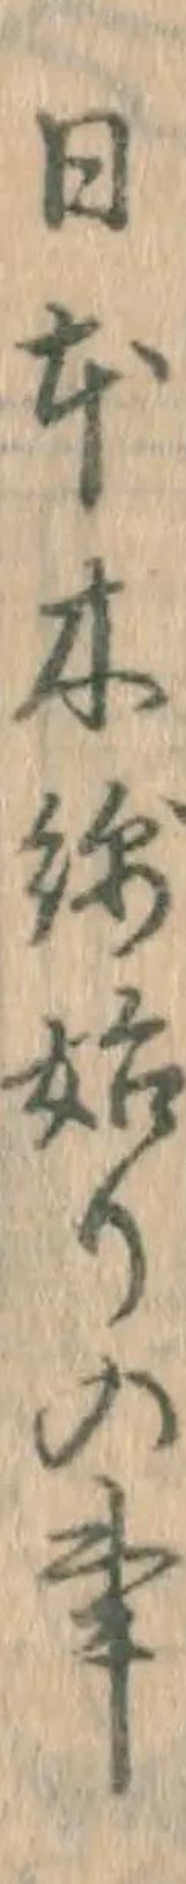日本木綿始りの事
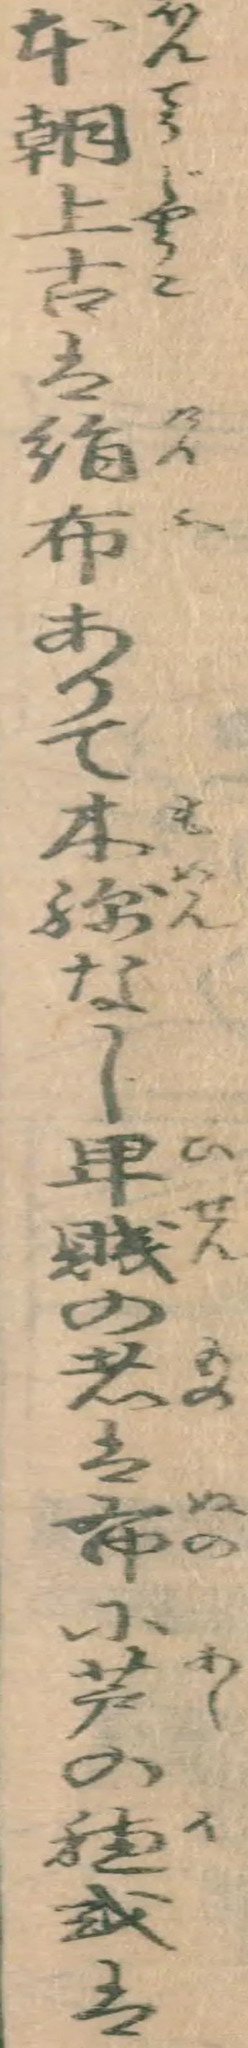本朝上古は絹布ありて木綿なし卑賤の者は布に芦の穂或は
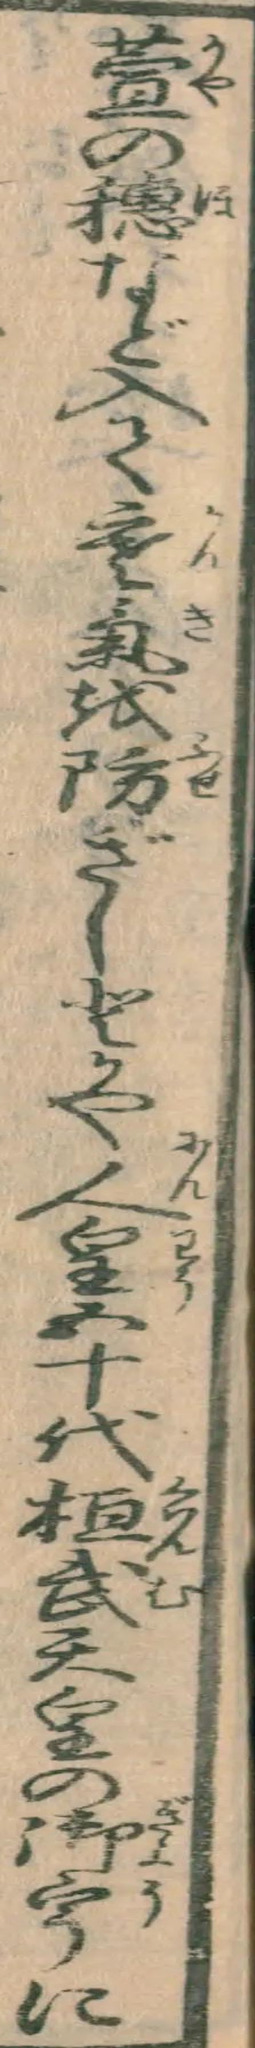萓の穂など人て寒気を防ぎしとかや人皇五十代桓武天皇の御宇に
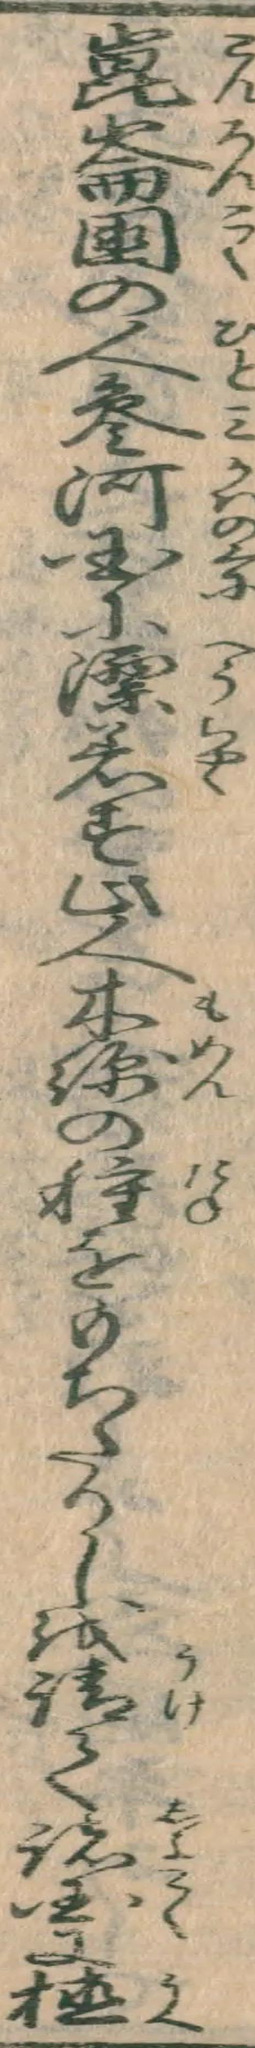崑崙国の人参河国に漂着す此人木綿の種をもちたりしを請て諸国に植
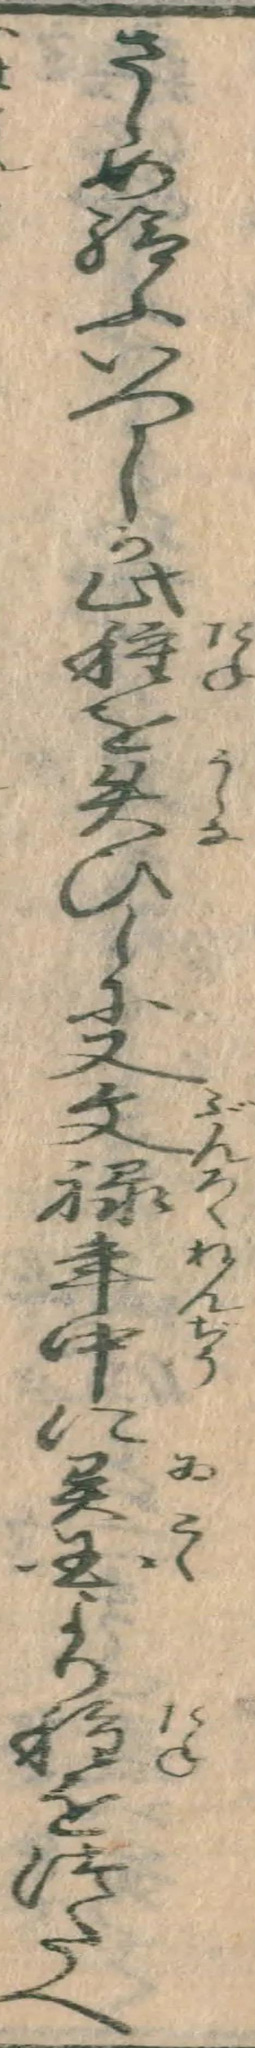さしめ給ふいつしか此種を失ひしに又文禄年中に異国より種をつたへ
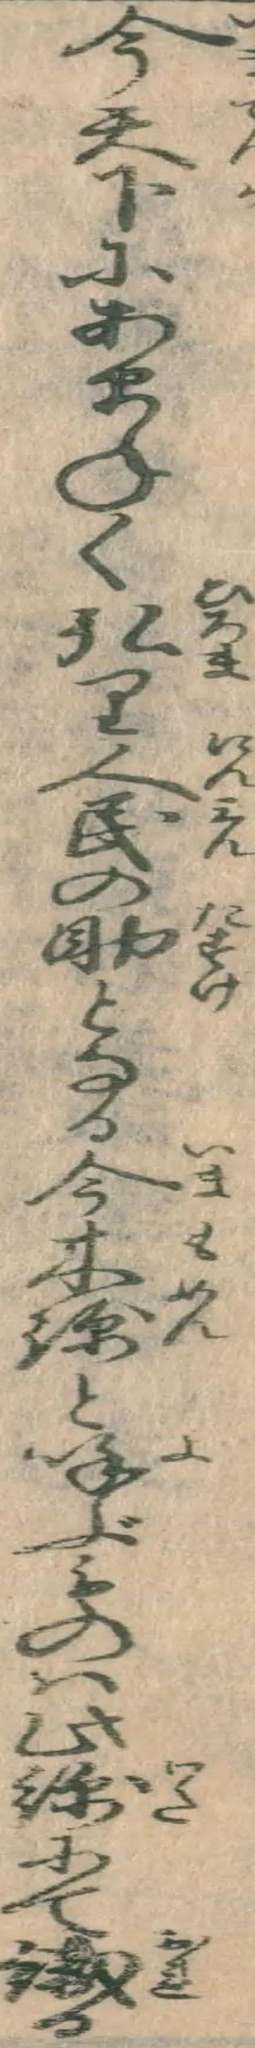今天下にあまねく弘り人民の助となる今木綿と呼ぶものは此綿にて織る
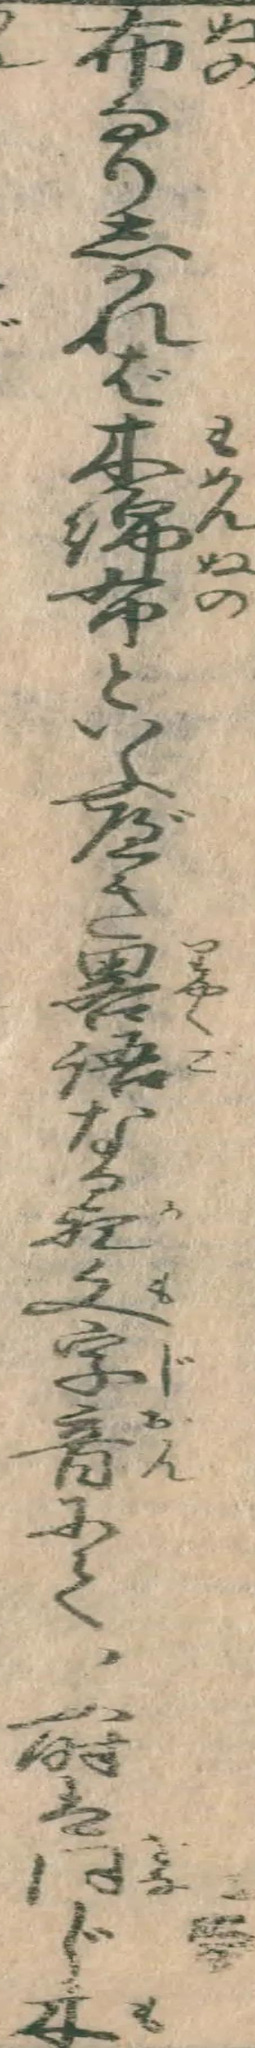布なりしかれば木綿布といふべき略語なる歟文字音にていふ時は同じ木
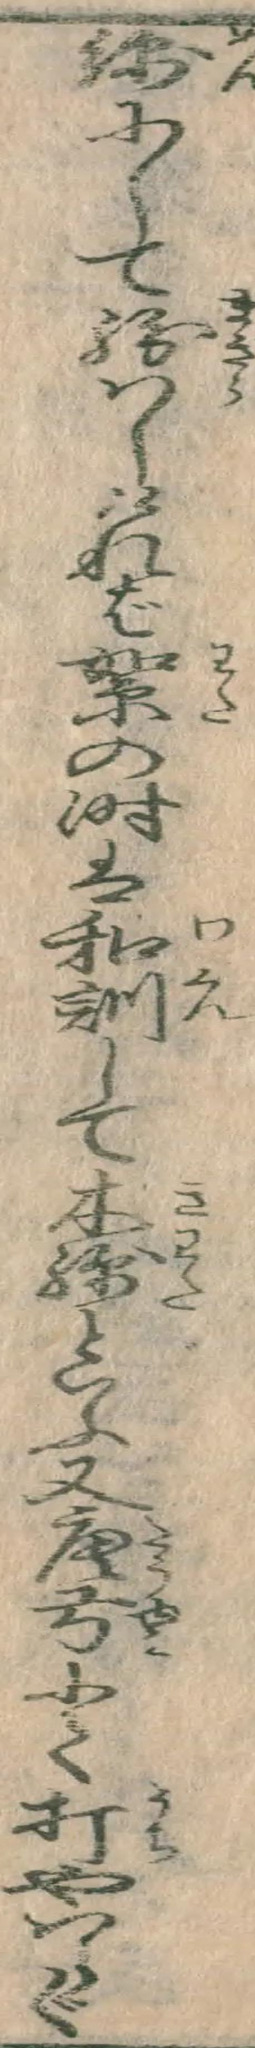綿にして紛はしければ絮の時は和訓して木綿といふ又唐弓にて打やはらぐ
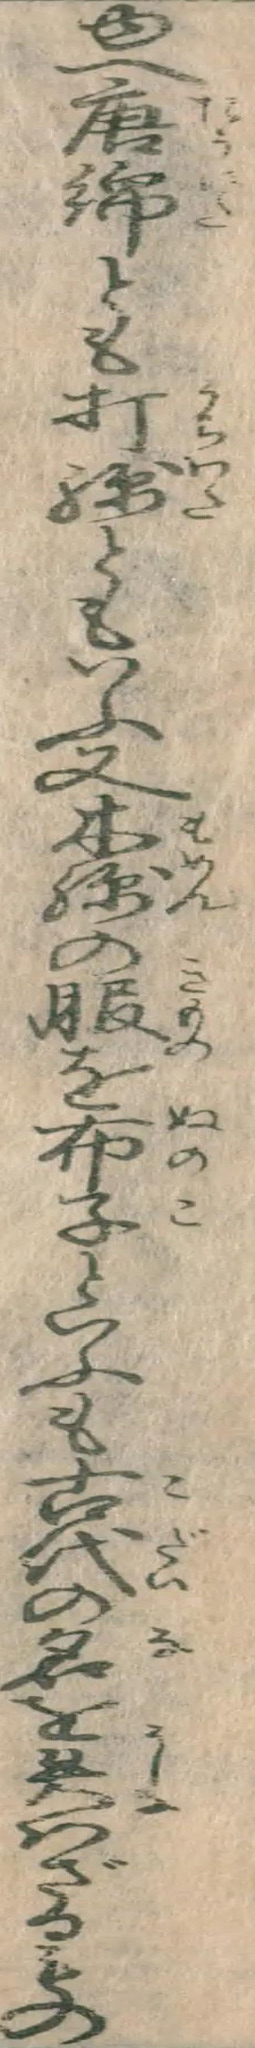ゆへ唐綿とも打綿ともいふ又木綿の服を布子といふも古代の名を失はざるもの
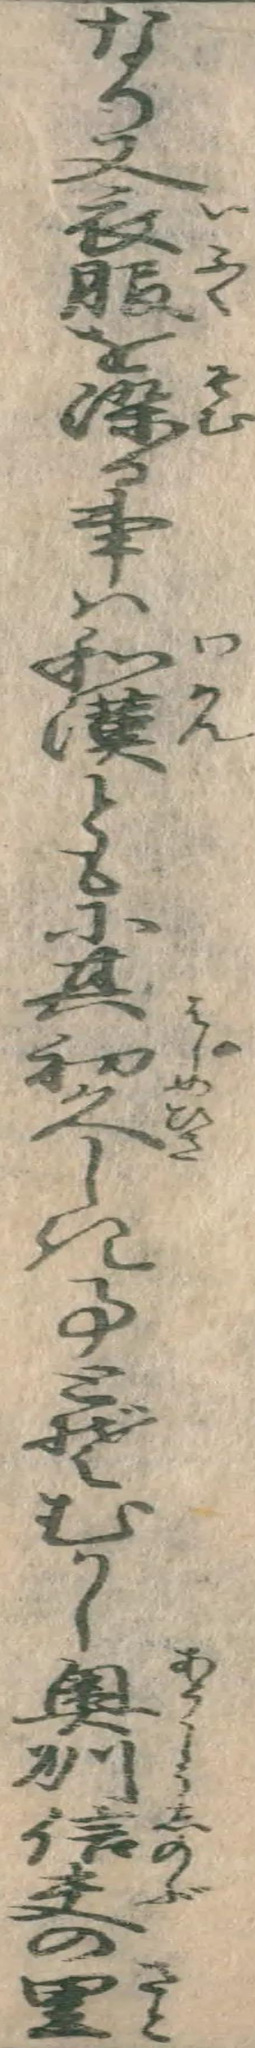なり又衣服を染る事は和漢ともに其初久しき事とぞむかし奥州信夫の里
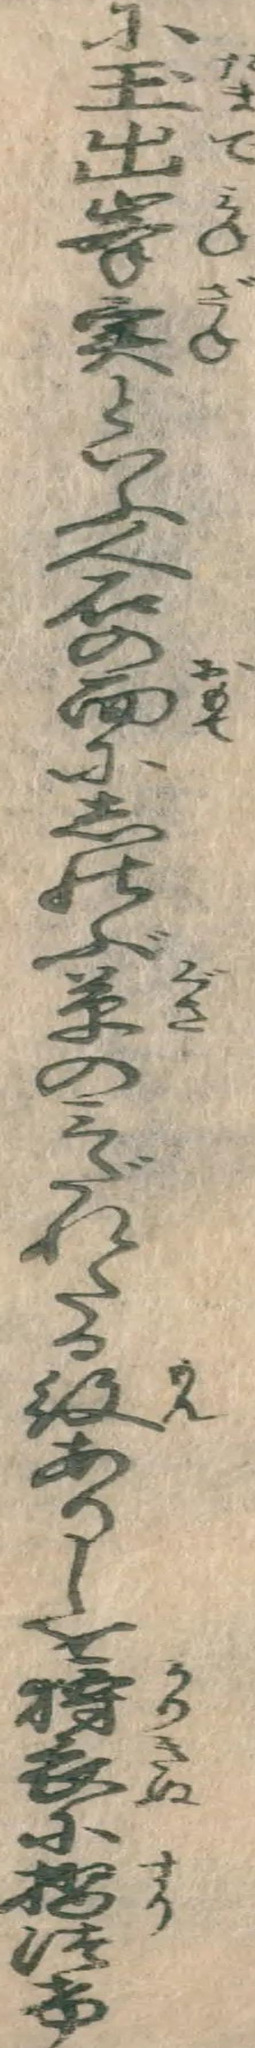に玉出峯実といふ人石の面にしのぶ草のみだれたる紋ありしを狩衣に摺つけ
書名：養蚕秘録 3巻. [3]
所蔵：国立国会図書館 National Diet Library, JAPAN
